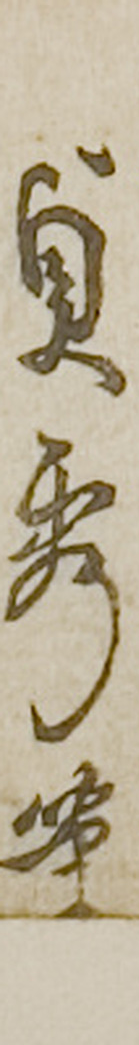貞秀筆
